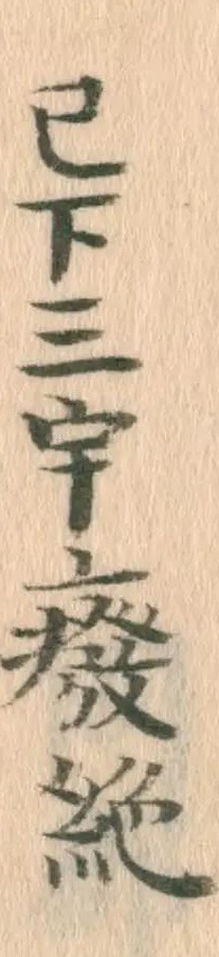已下三宇廃絶
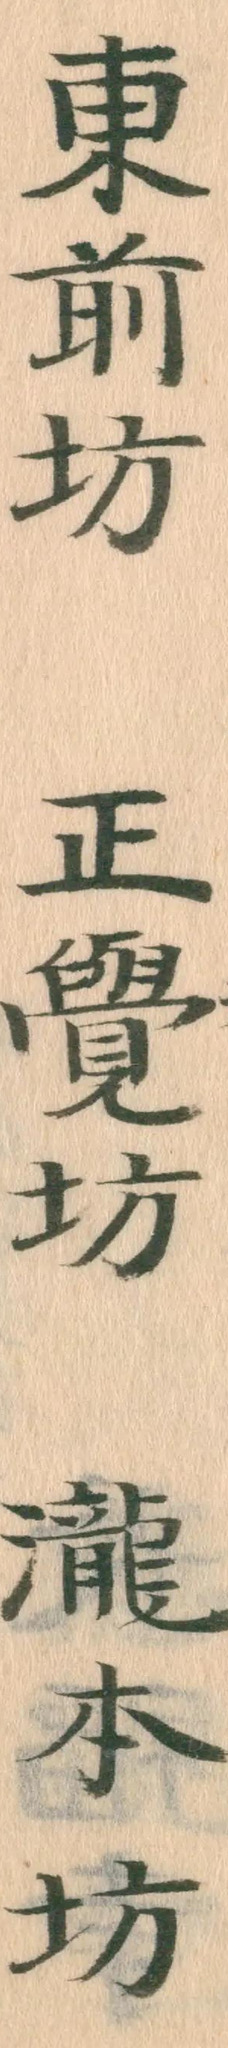東前坊正覚坊瀧本坊
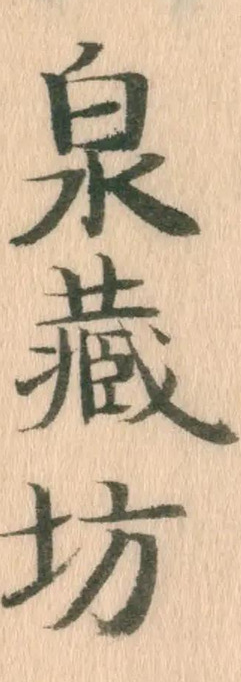泉蔵坊
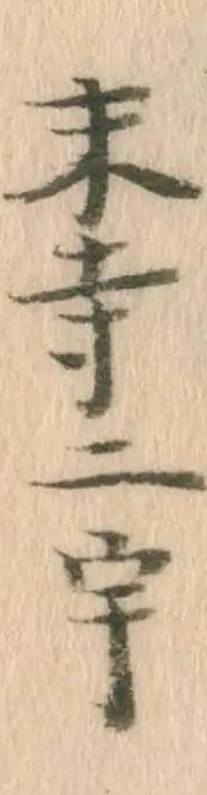未寺二宇
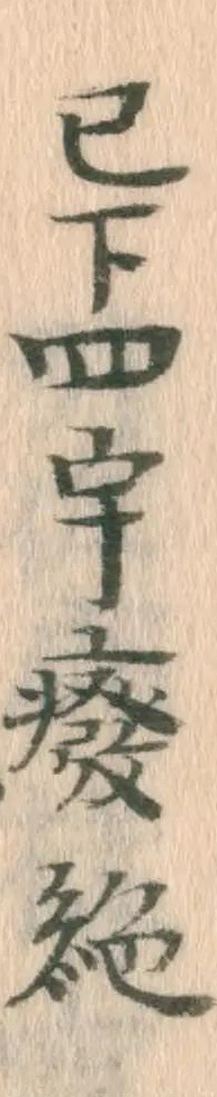已下四宇廃絶
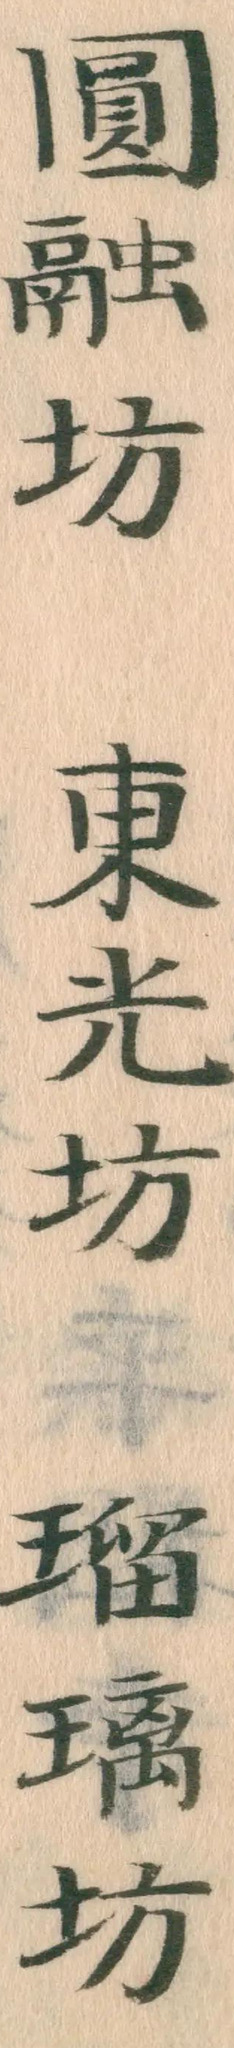円融坊東光坊瑠璃坊
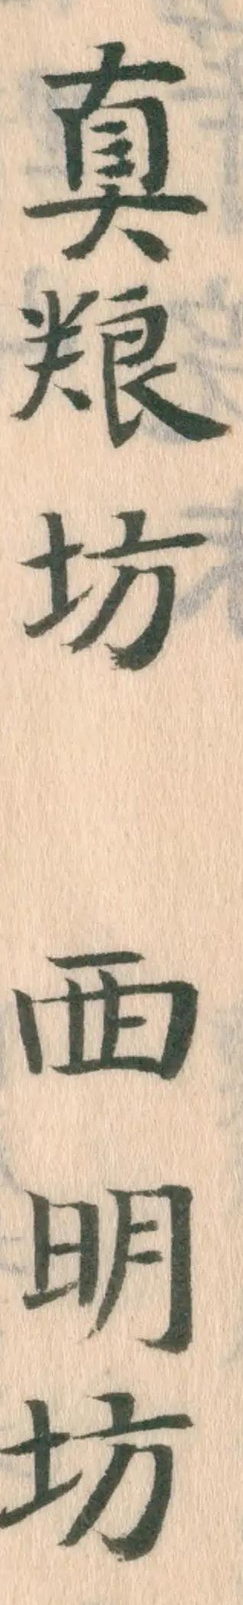真羪坊西明坊
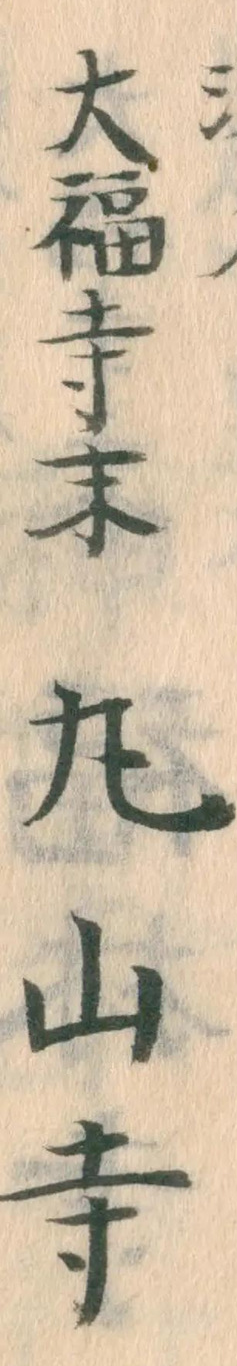大福寺未丸山寺

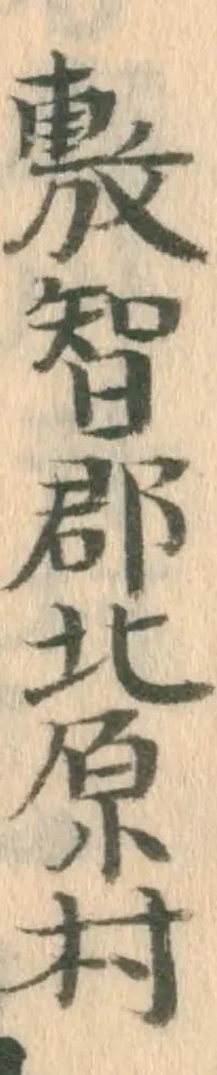智郡北原村
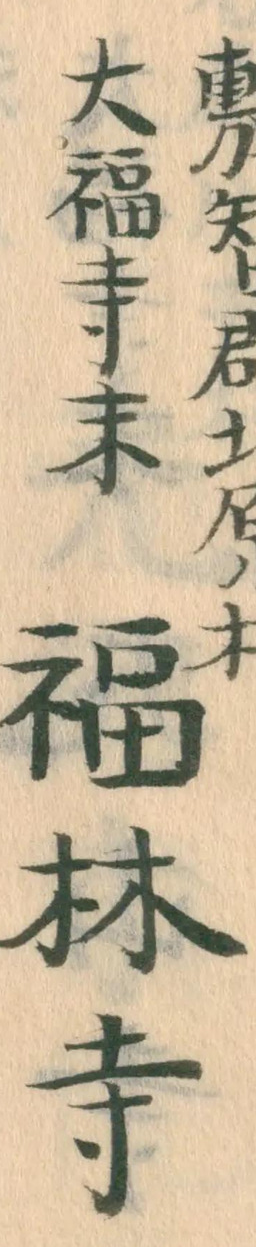大福寺未福林寺
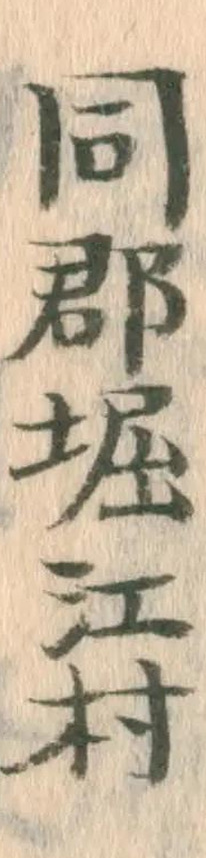同郡堀江村
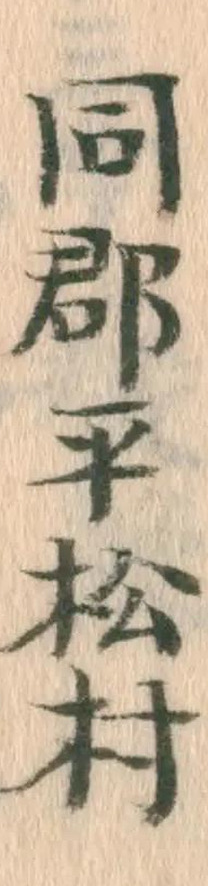同郡平松村
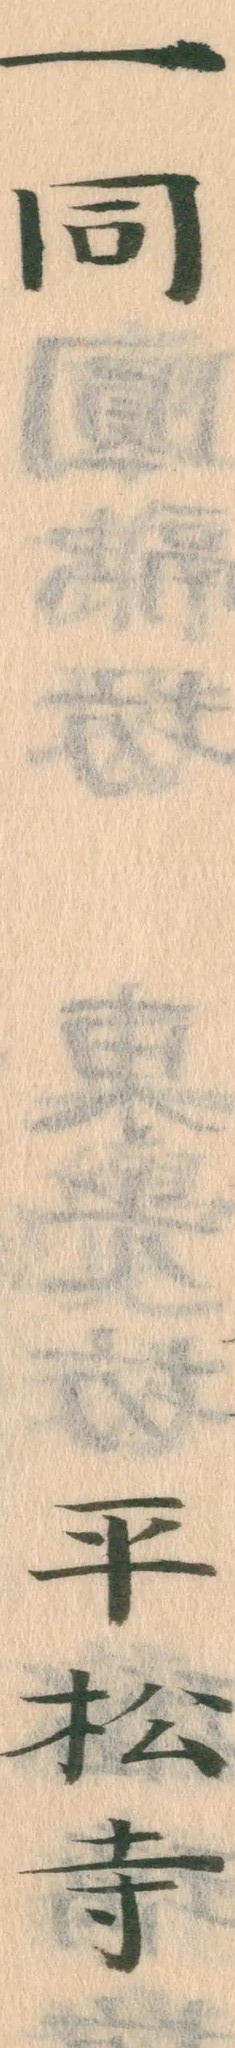一同平末寺
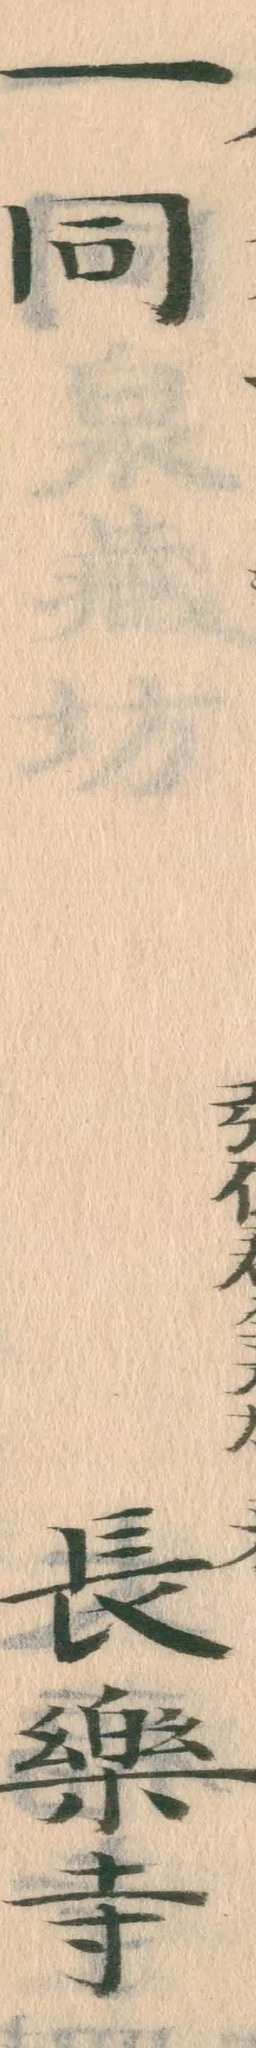一同長楽寺
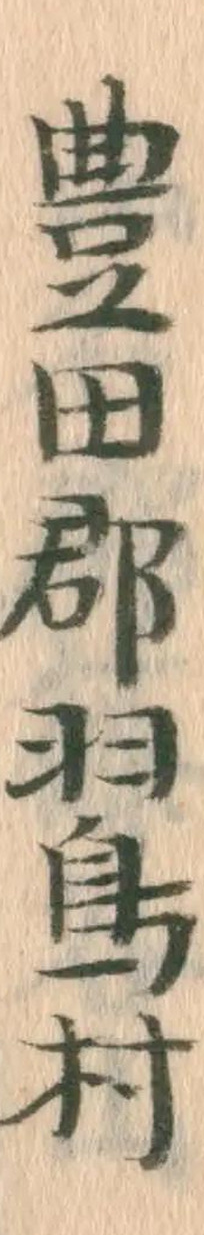豊田郡中泉村
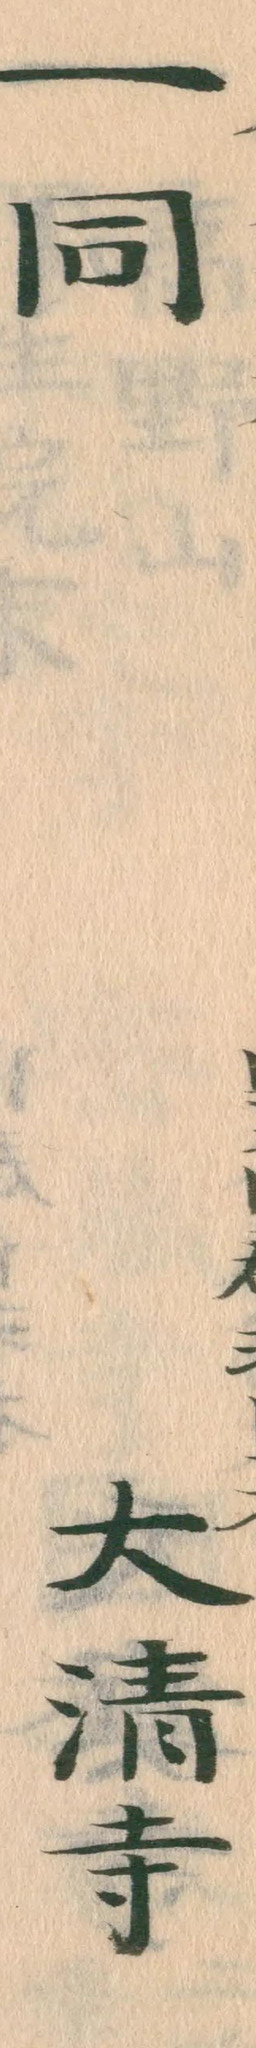一同大清寺
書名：古義真言宗本末帳 21巻. [4] 第三 伊賀国、伊勢国、志摩国、尾張国、三河国、遠江国、駿河国、伊豆国、甲斐国
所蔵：国立国会図書館 National Diet Library, JAPAN
